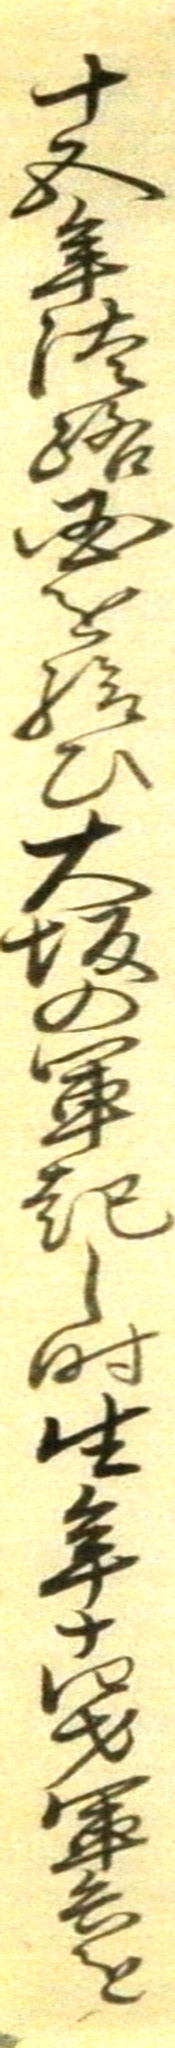十五年淡路国を給ひ大坂の軍起し時生年十四才軍兵を
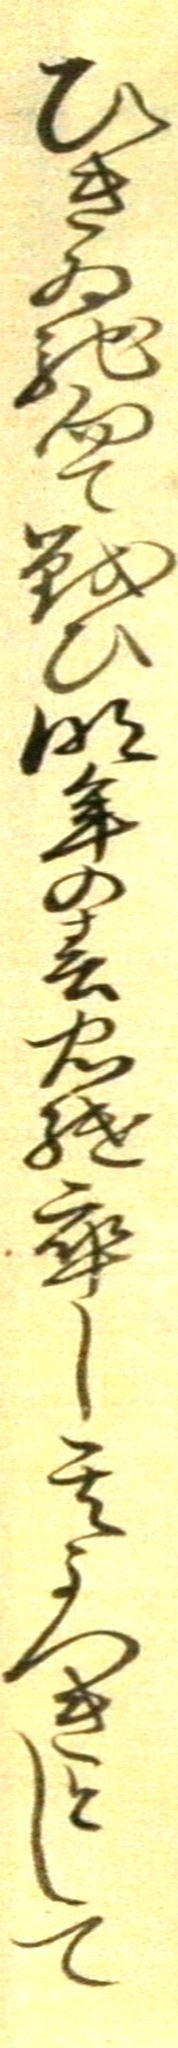ひきゐ馳向て戦ひ明年の春忠継卒し其よつきとして

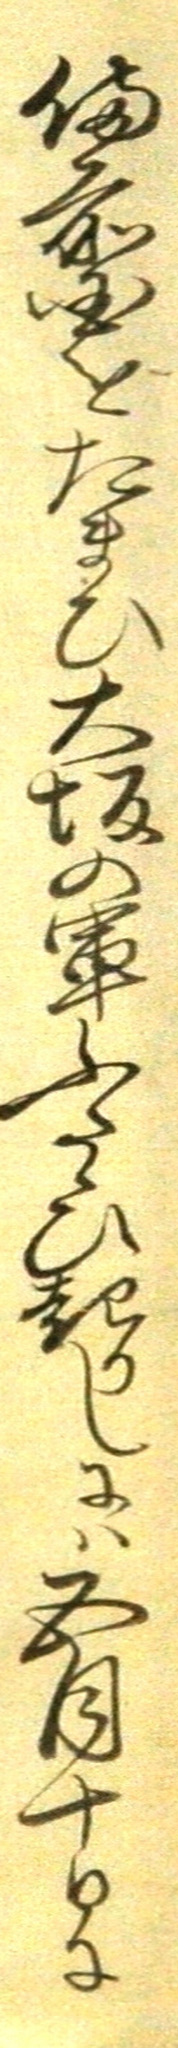備前国をたまひ大坂の軍ふたゝひ起りしには五月十日に
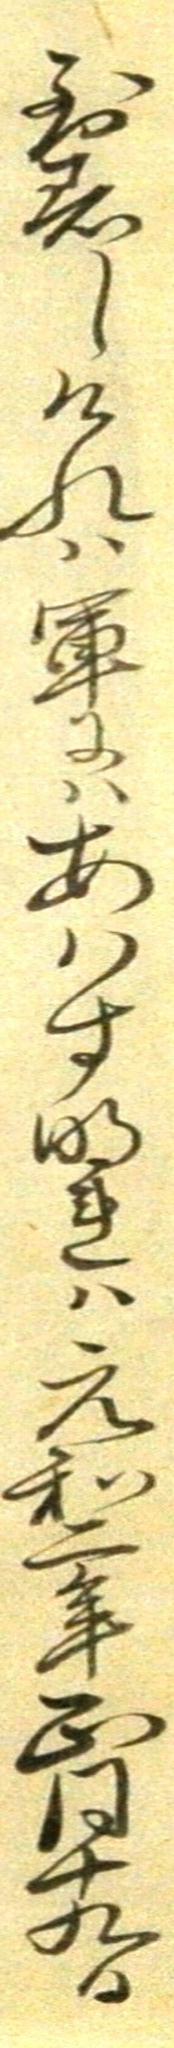到着しけれは軍にはあはす明れは元和二年正月十九日
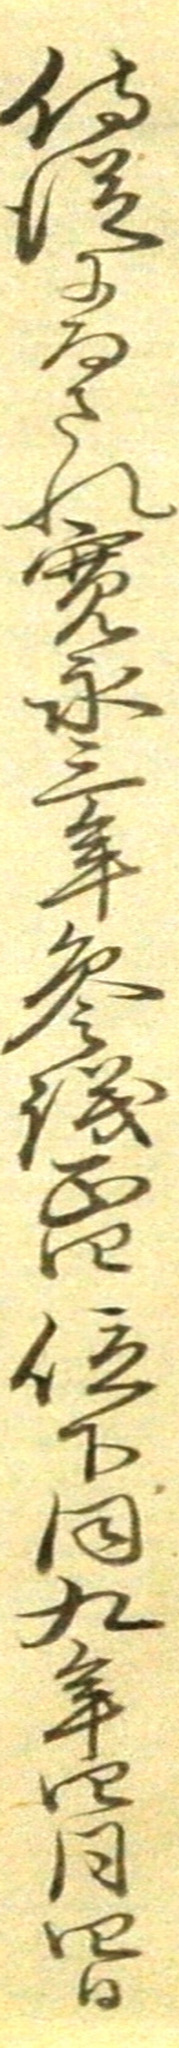侍従になされ寛永三年参議正四位下同九年四月四日
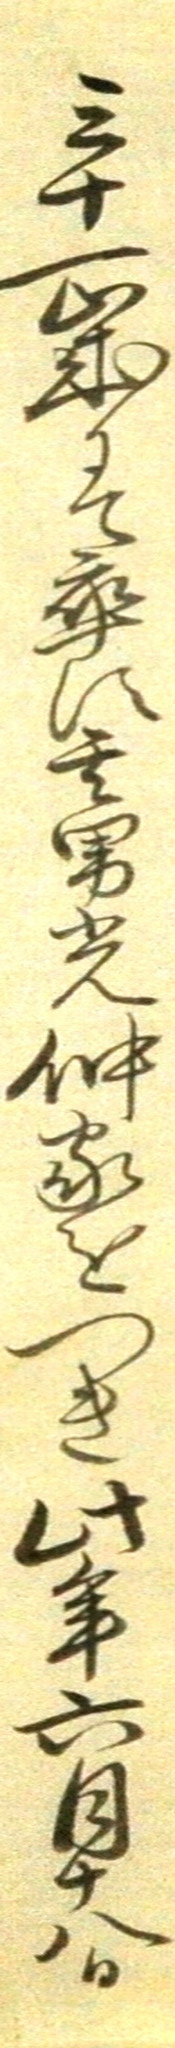三十一歳にて卒す其男光仲家をつき此年六月十八日
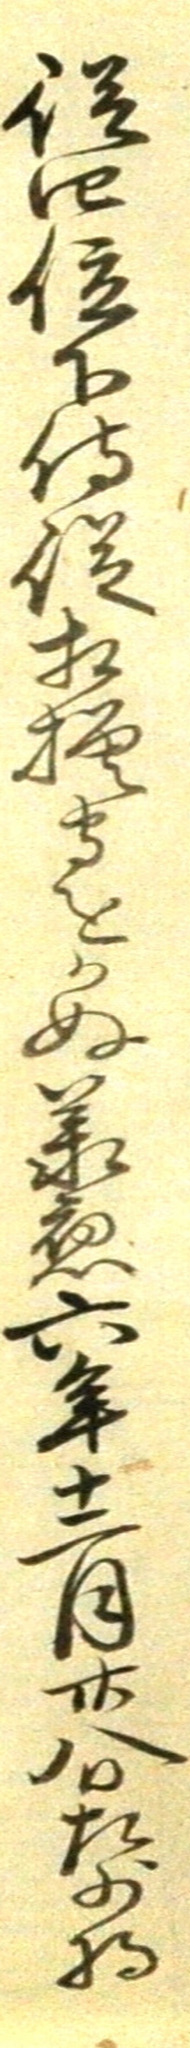従四位下侍従相模守をかぬ承応六年十二月廿八日左少将
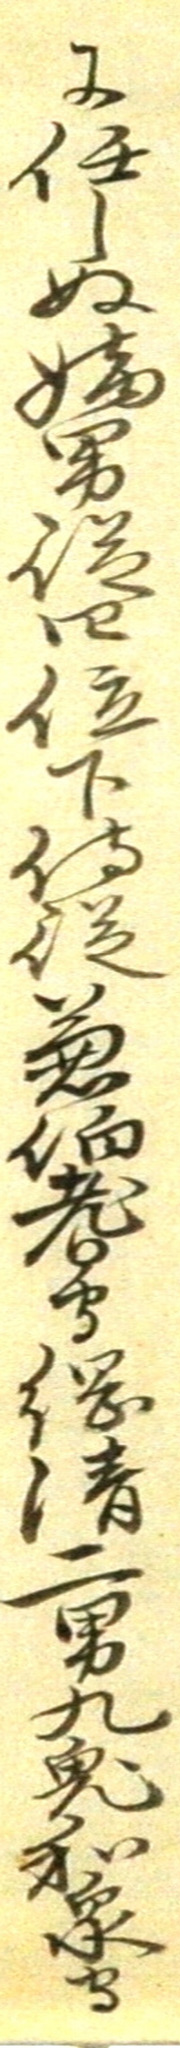に任しぬ嫡男従四位下侍従兼伯耆守綱清二男九鬼和泉守
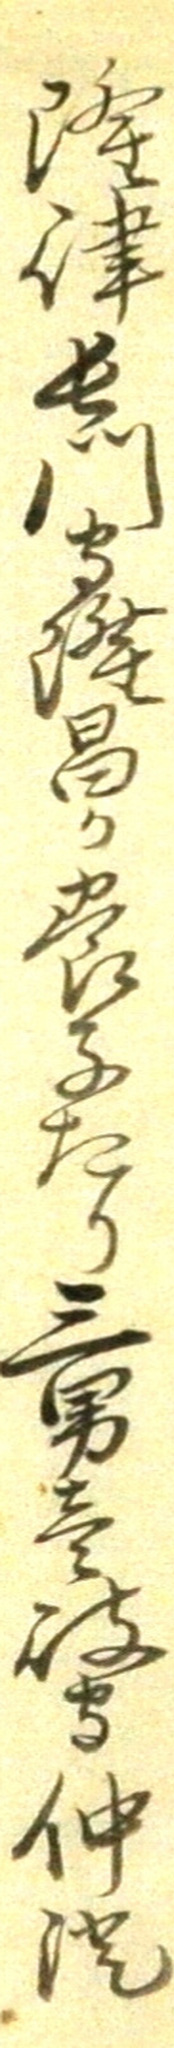隆律長門守隆昌か養子たり三男壱岐守仲澄
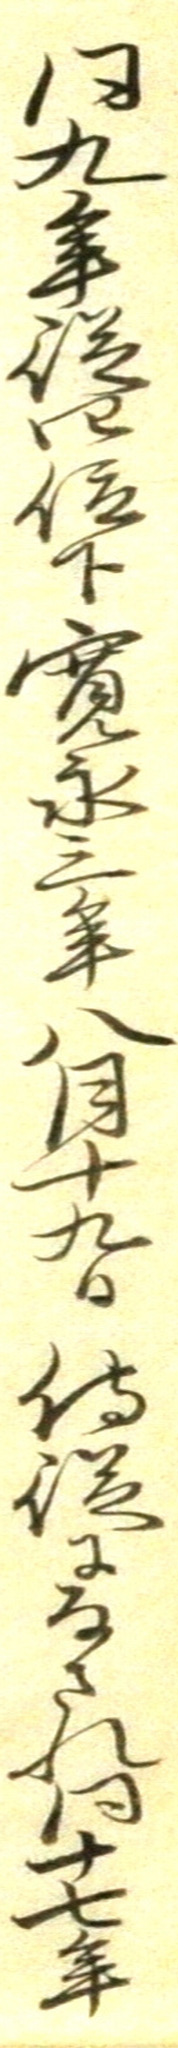同九年従四位下寛永三年八月十九日侍従になされ同十七年
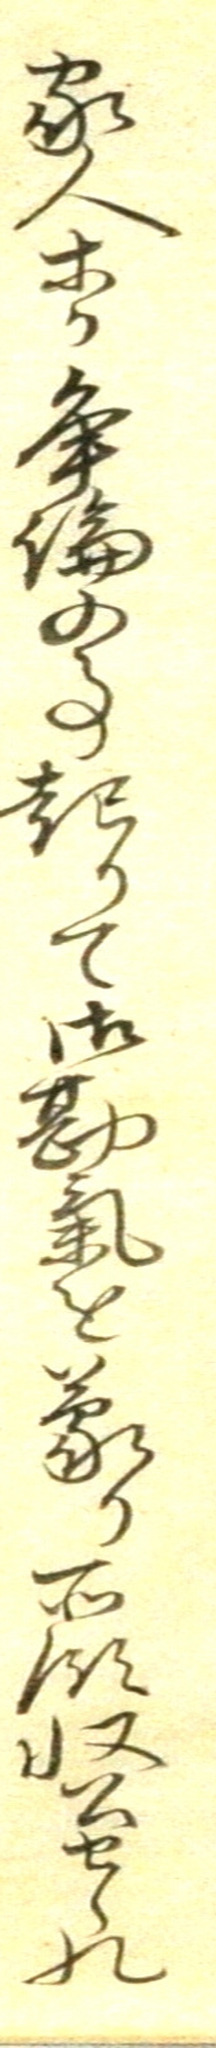家人等か争論の事起りて御勘気を蒙り所領收公せられ
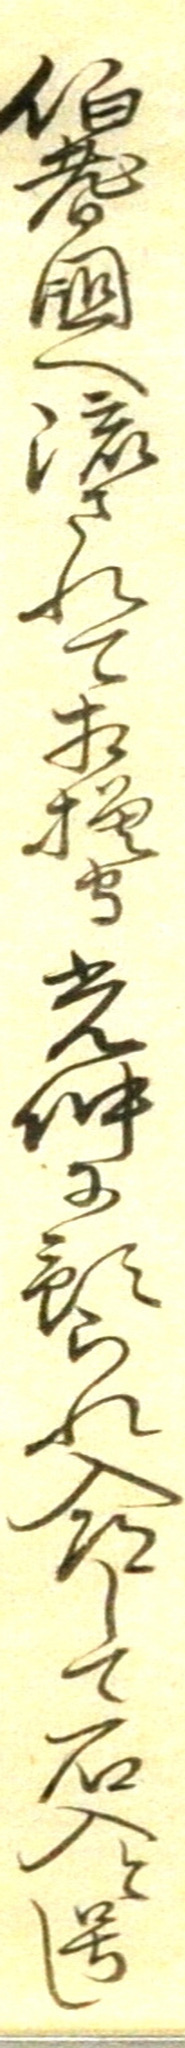伯耆国へ流されて相模守光仲に預られ入道して石入と号し
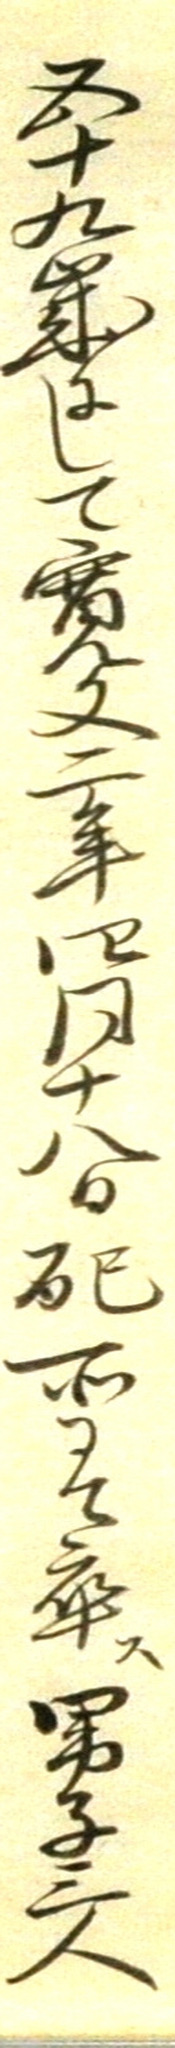五十九歳にして寛文二年四月十八日配所にて卒ス男子三人

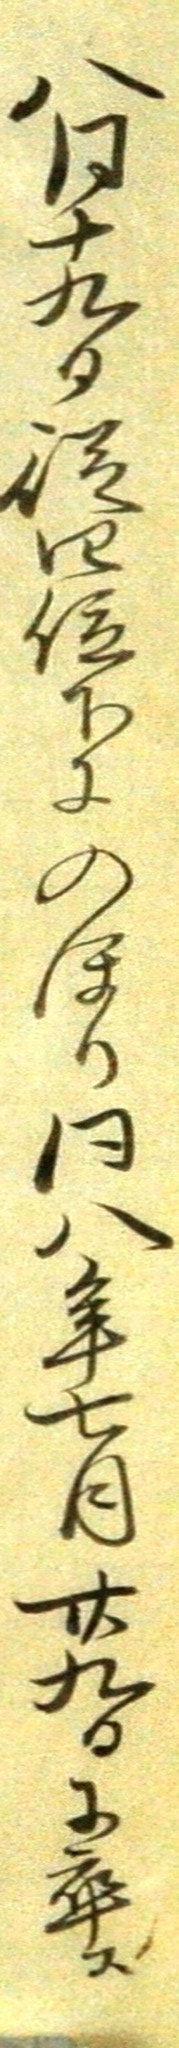八月十九日従四位下にのほり同八年七月廿九日に卒ス
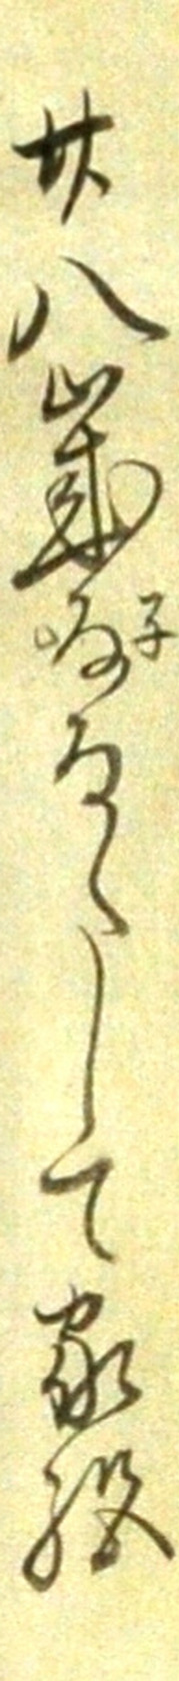廿八歳ななくして家絶
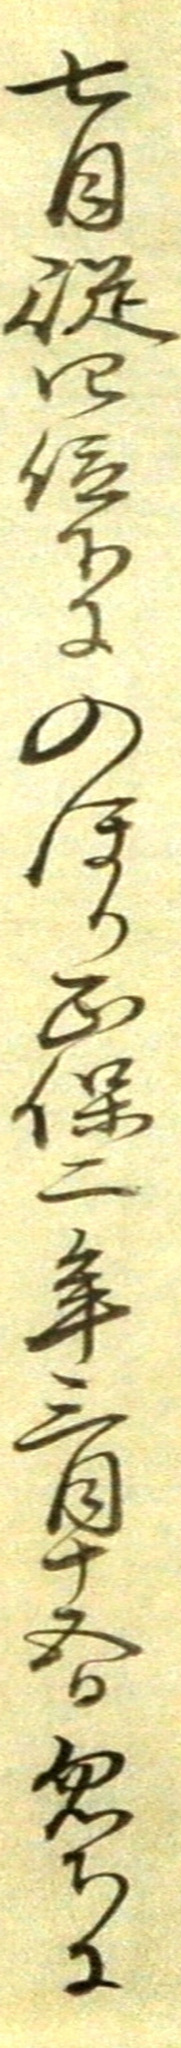七月従四位下にのほり正保二年三月十五日忽ちに
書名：藩翰譜（七・上）
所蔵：伊那市立高遠町図書館・合同会社AMANE
